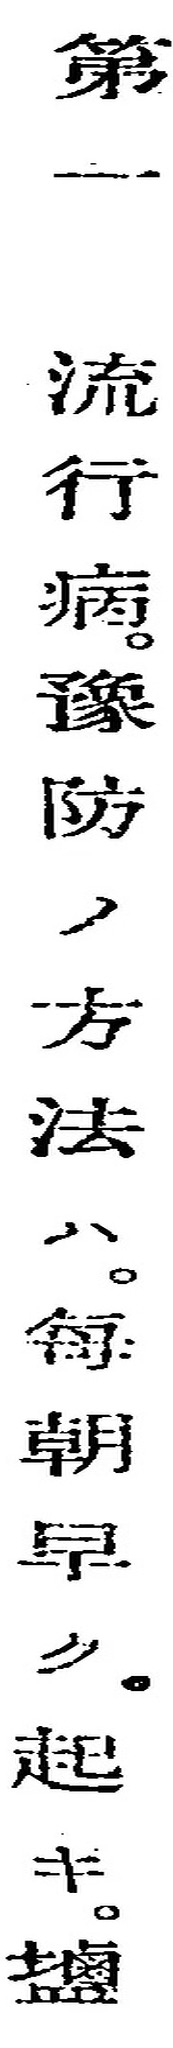第一流行病。予防の方法は。毎朝早く。起き。壚
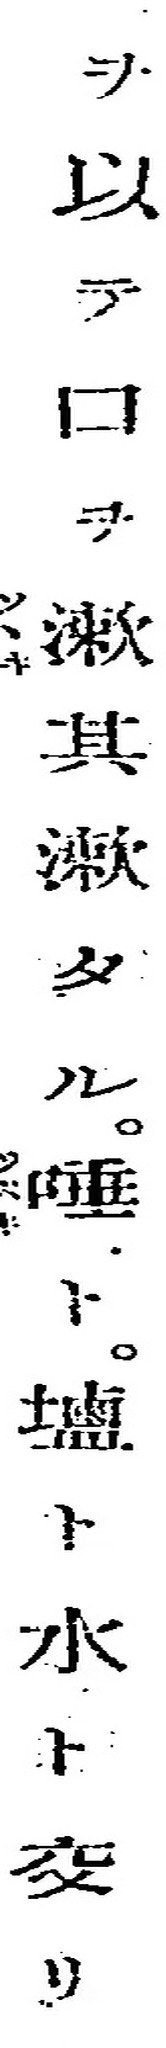を以て口を漱其漱たる。唾と。壚と水と交り
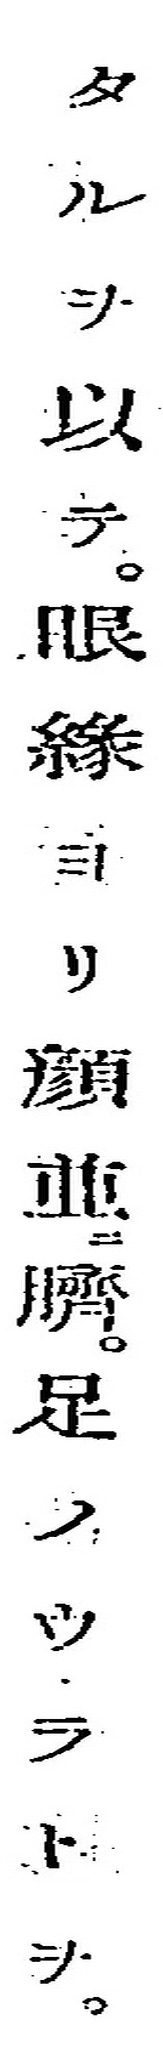たるを以て。眼縁より顔並に臍。足のうらとを。
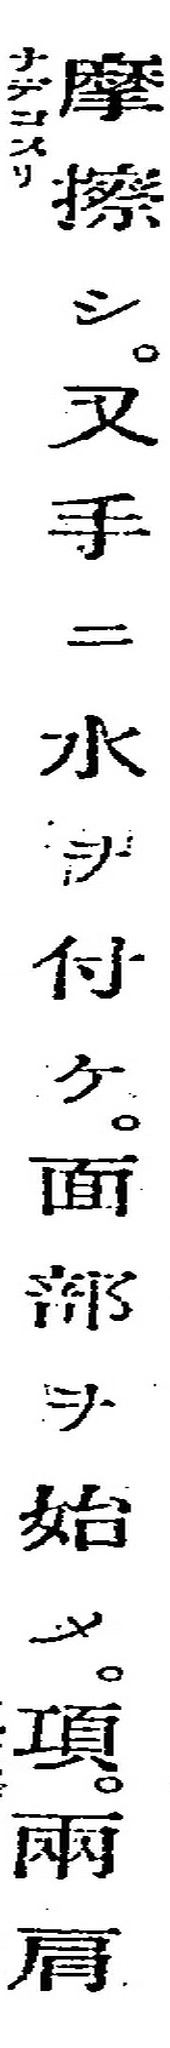摩擦し。又手に水をつけ。面部を始め。項両肩
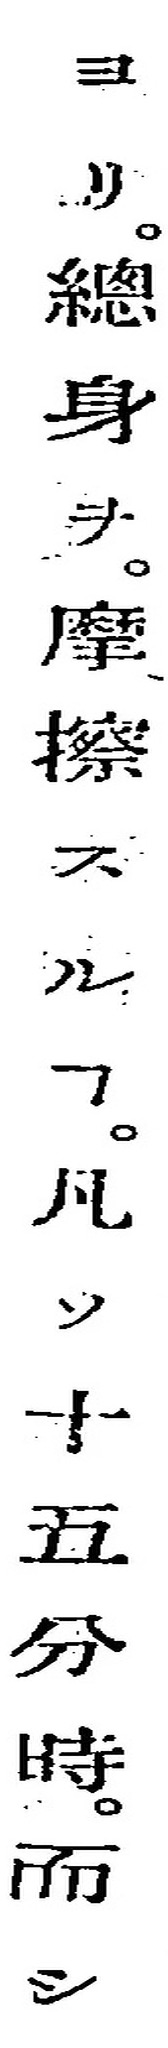より。総身を。摩擦すること。凡そ十五分時。而し
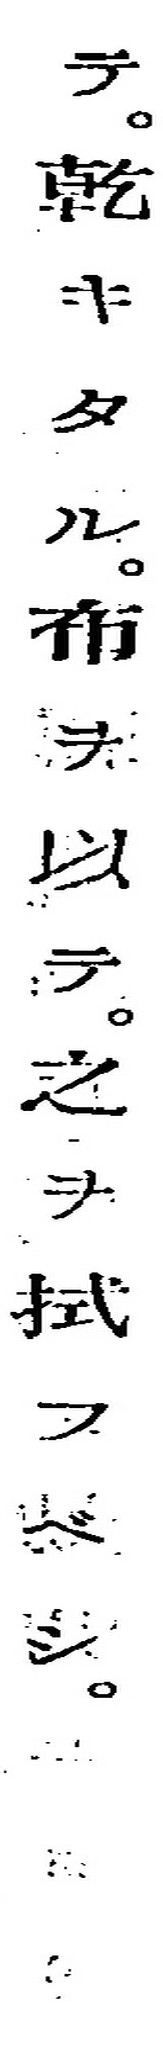て。乾きたる。布を以て。之を拭ふべし。
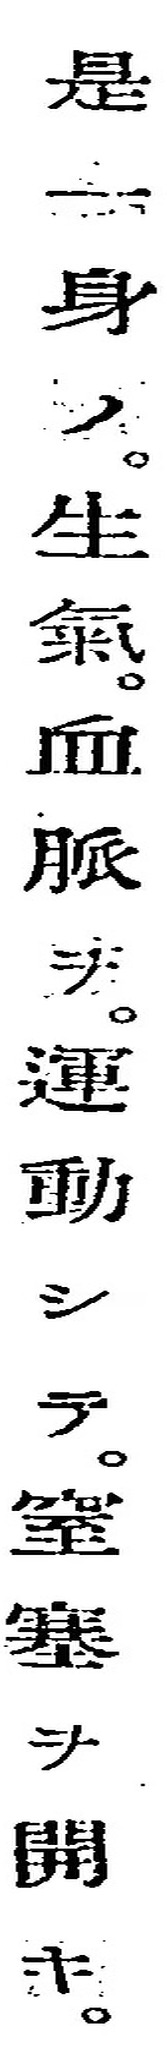是一身の。生気。血脈を。運動して。窒塞を開き。
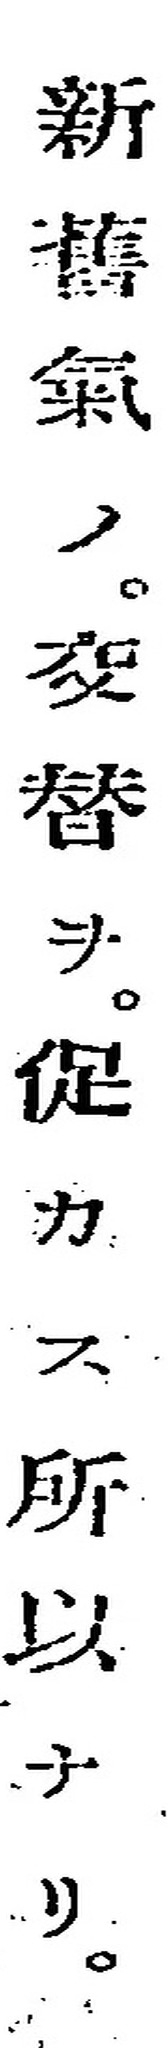新舊気の。交替を。促かす所以なり。
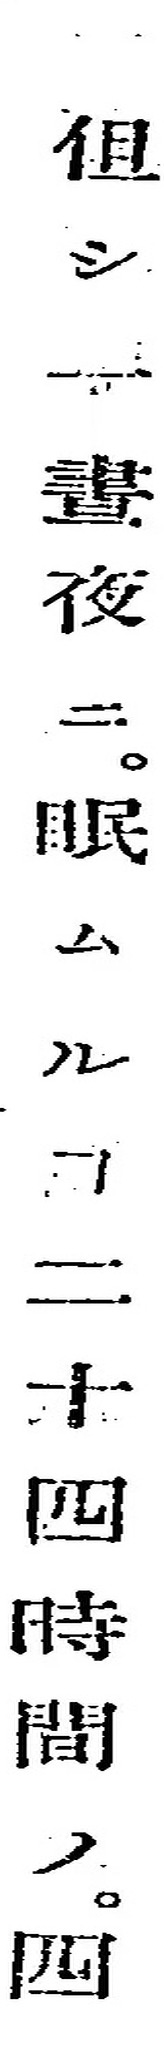但し一晝夜に。眠ること二十四時間の。四
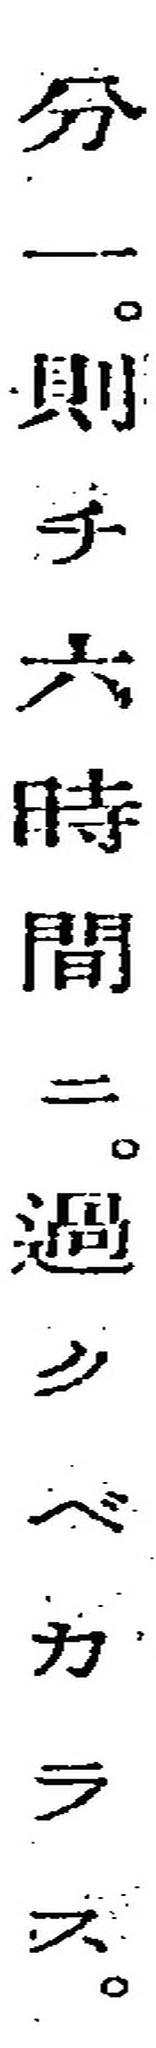分一。則ち六時間に。過くべからす。
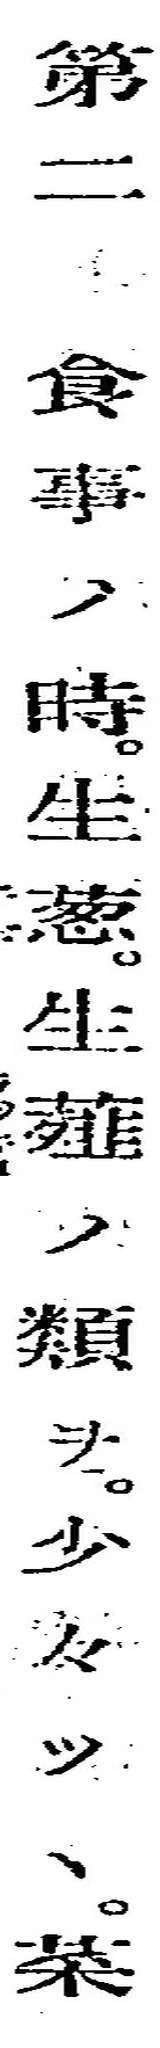第二食事の時。生葱。生薤の類を。少々つゝ。菜
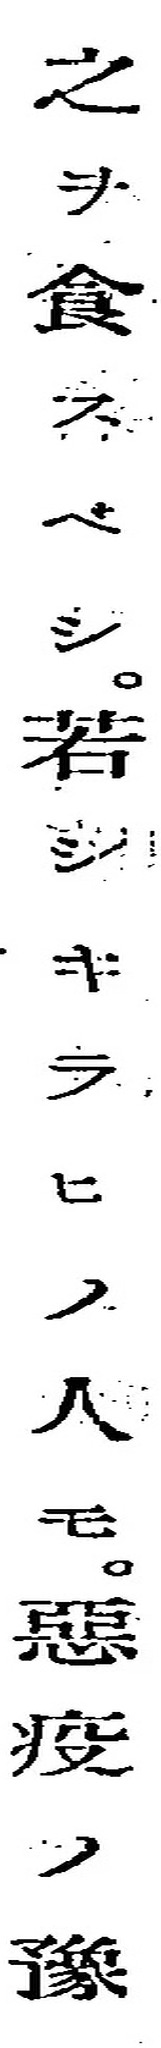之を食すべし。若しきらひの人も。悪疫の予
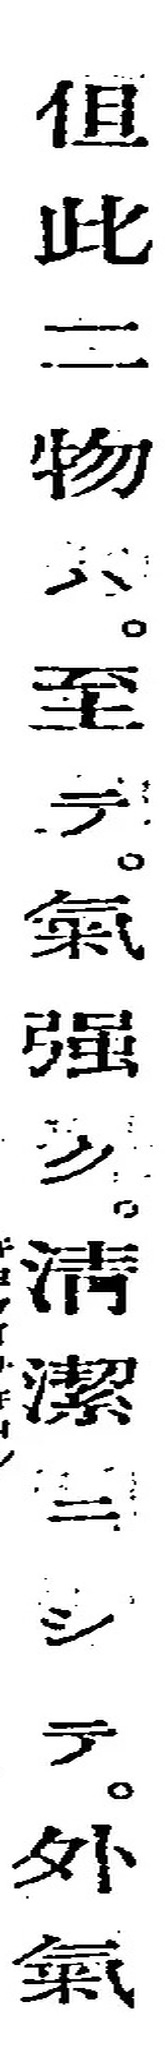但此二物は、至て。気強く。清潔にして。外気
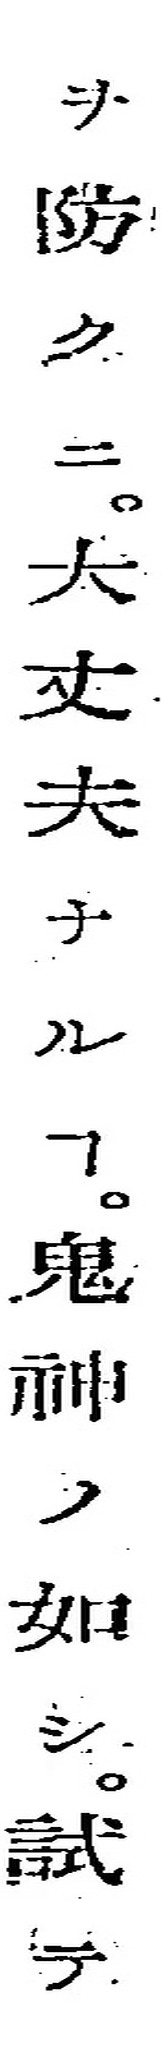を防くに。大丈夫なること。鬼神の如し。試て

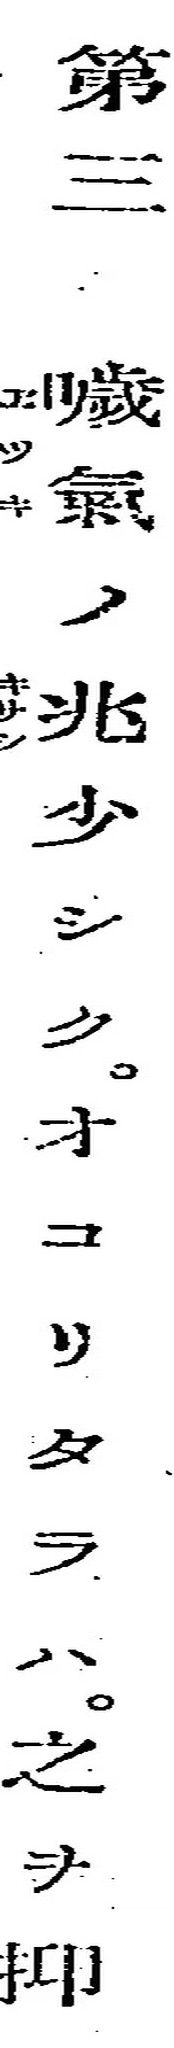第三噦気の兆少しく。おこりたらは。之を抑
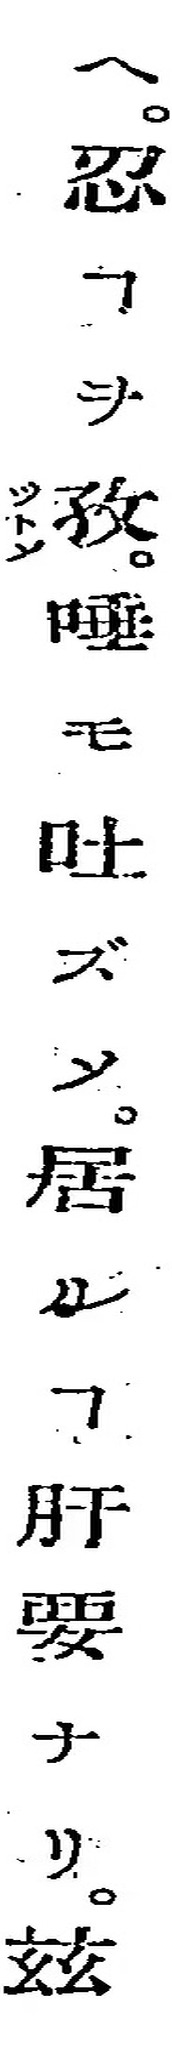へ。忍ことを孜。唾も吐ずして。居ること肝要なり。玆
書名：駆疫法 : コレラヲヨケ並ニナホスシカタ
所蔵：国立国会図書館 National Diet Library, JAPAN
